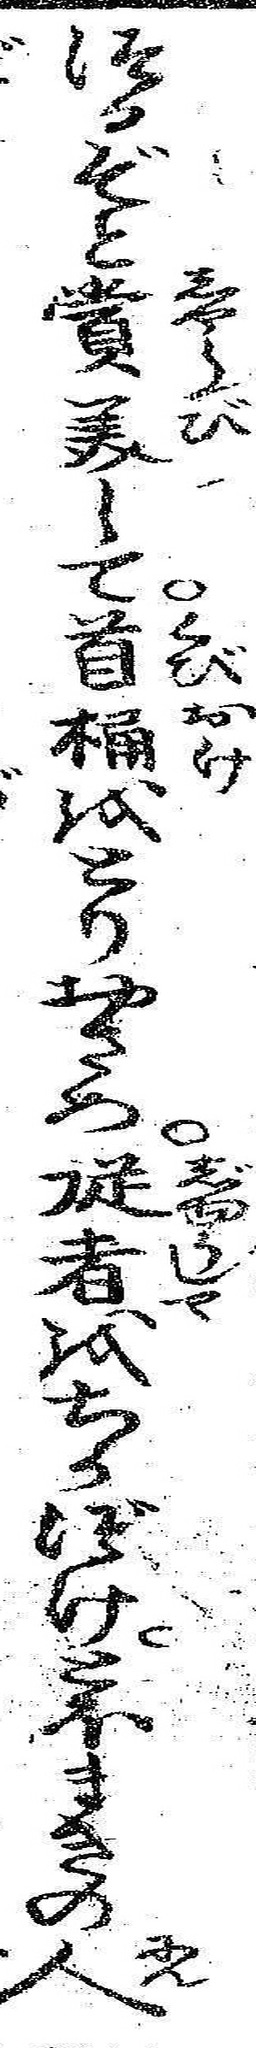つるぞと賞美して。首桶をとりおさめ。従者をちかづけ。とほまきの人
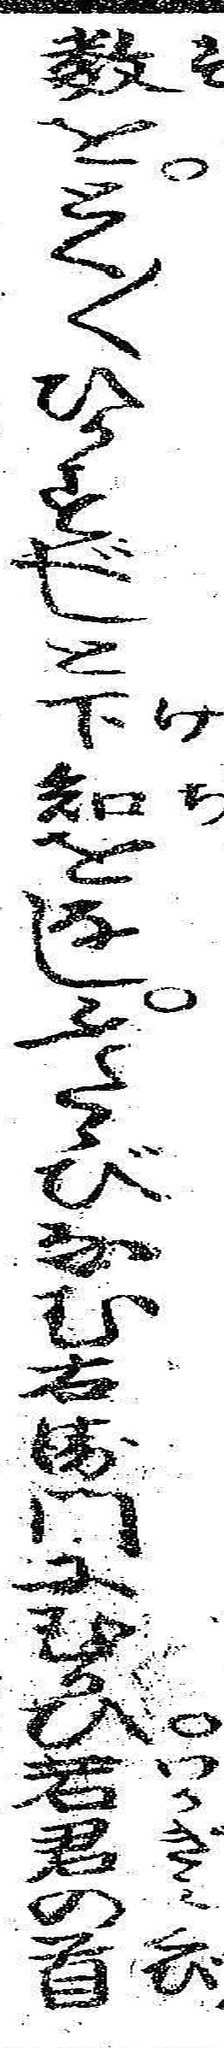数を。とく〳〵ひかすべしと下知をなし。ふたゝびなむ右衛門にむかひ。若君の首
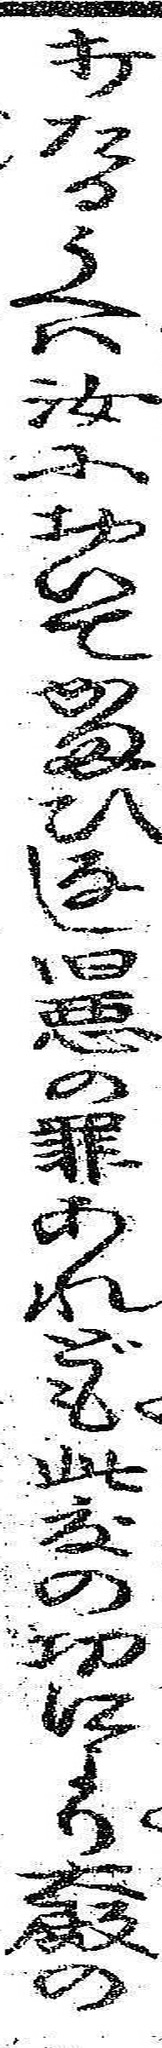打たるうへは。汝においてかまひなし。旧悪の罪あれども。此度の㓛により。大殿の
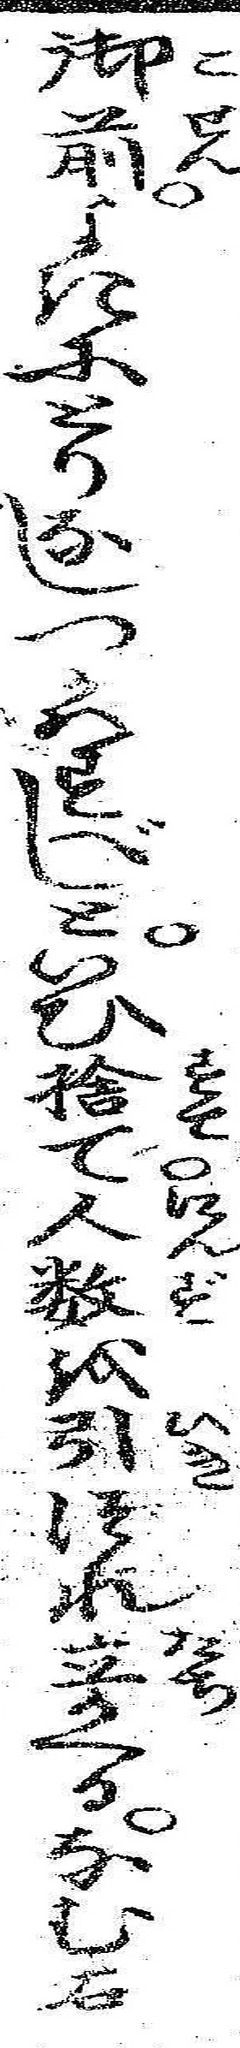御前。よきにとりなしつかはすべしと。いひ捨て。人数を引つれ立かへる。なむ右
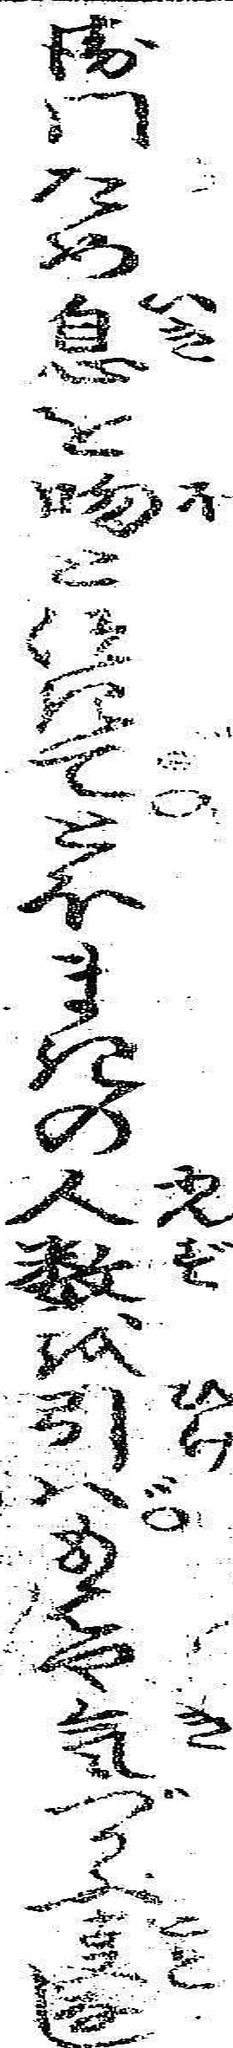衛門ため息を吻とつきて。とほまきの人数を引ば。もはや気づかふ事なし

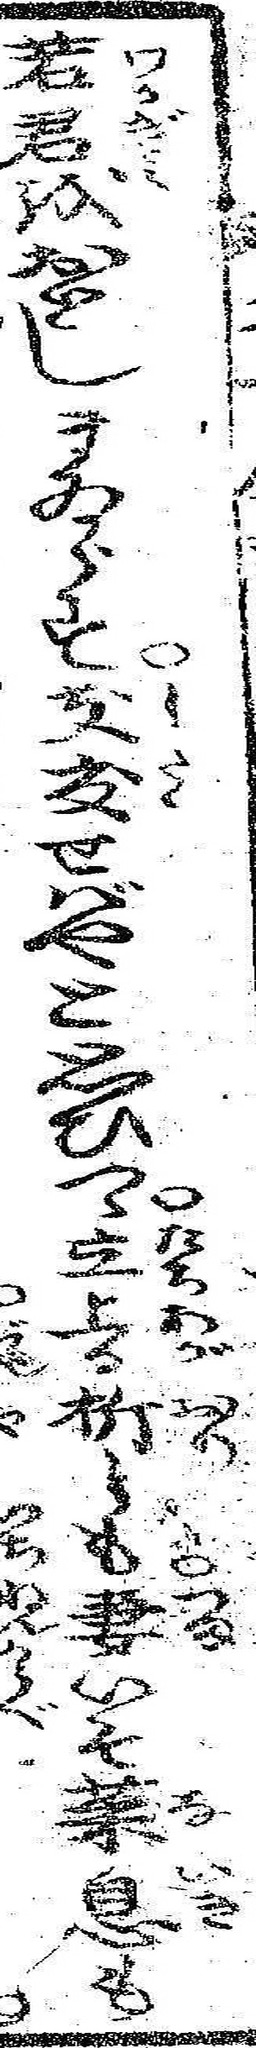若君をおとしまゐらす。支度せばやと思ひつゝ。立上る折しも。妻いそ菜息も
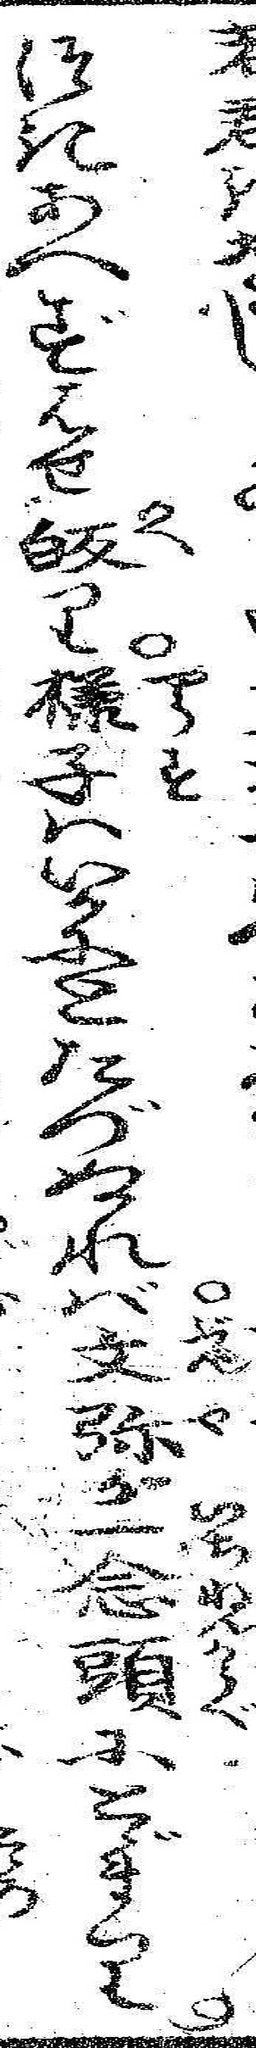つきあへずはせ帰り。様子はいかにとたづぬれば。文弥が一念頭にとゞまり。
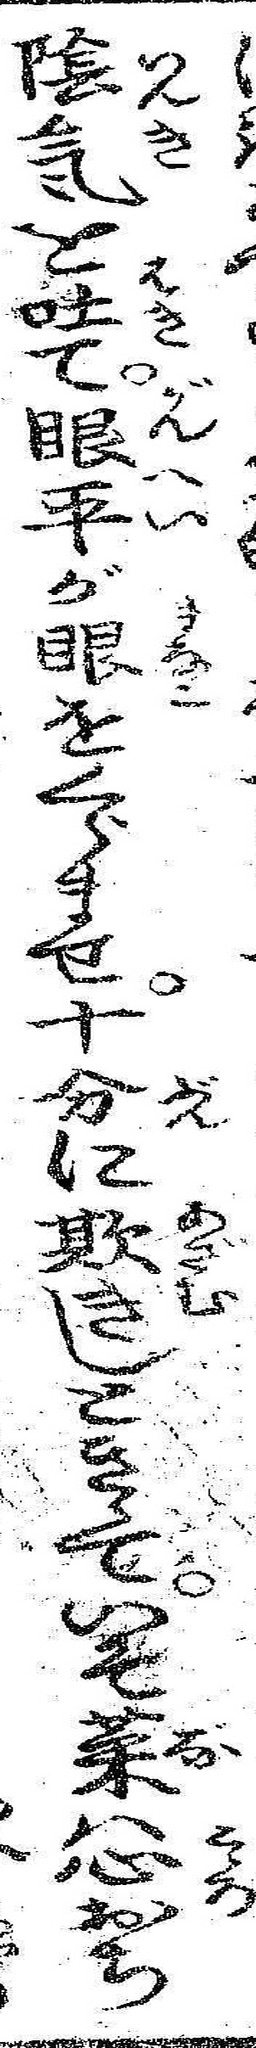陰気を吐て。眼平が眼をくらませ。十分に欺きしときゝて。いそ菜は心おち
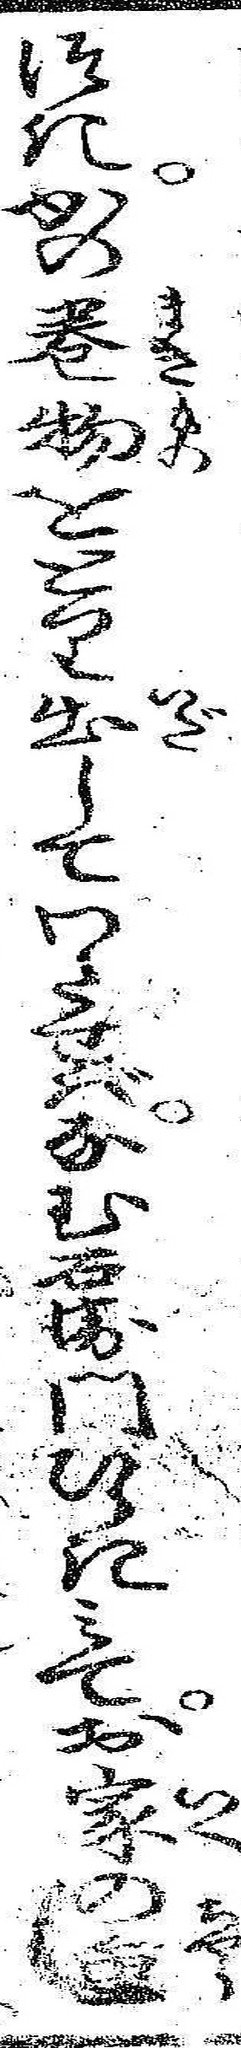つき。かの巻物をとり出してわたせば。なむ右衛門ひらきみて。お家の重
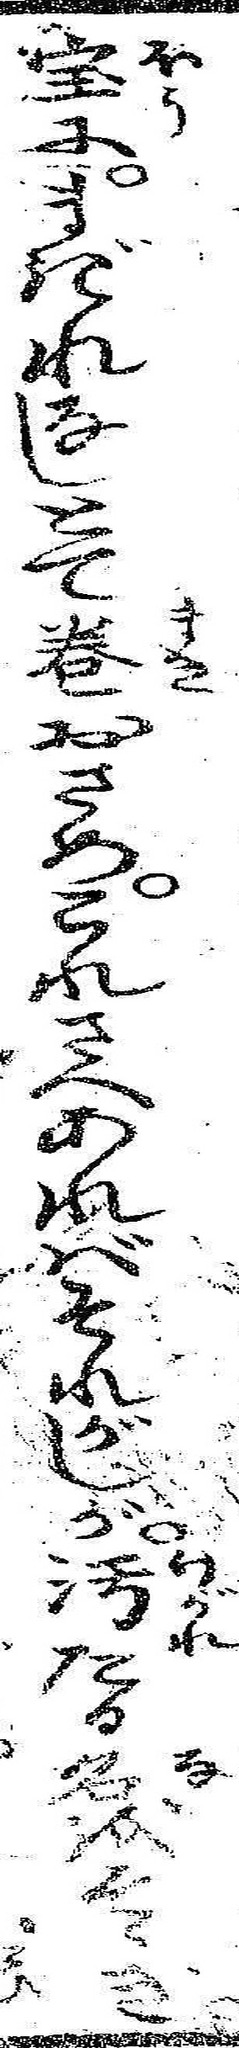宝に。まぎれなしとて巻おさめ。これさへあればそれがしが。汚たる名をそゝぎ。
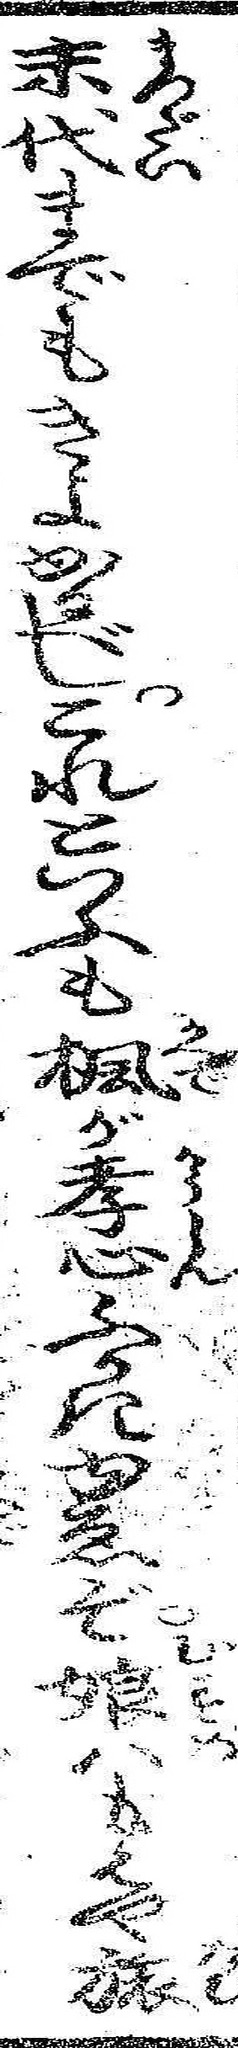末代までもきよかるべし。これといふも楓が孝心ふかきゆゑぞ。娘はもはや旅
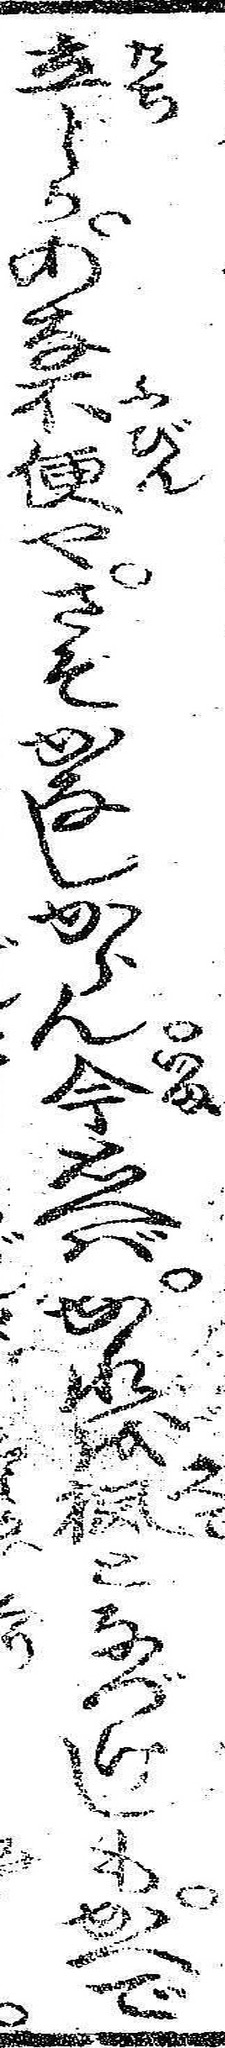立しか。あな不便や。さそかなしからん。今思へば。かれを楓となづけしも。かへで
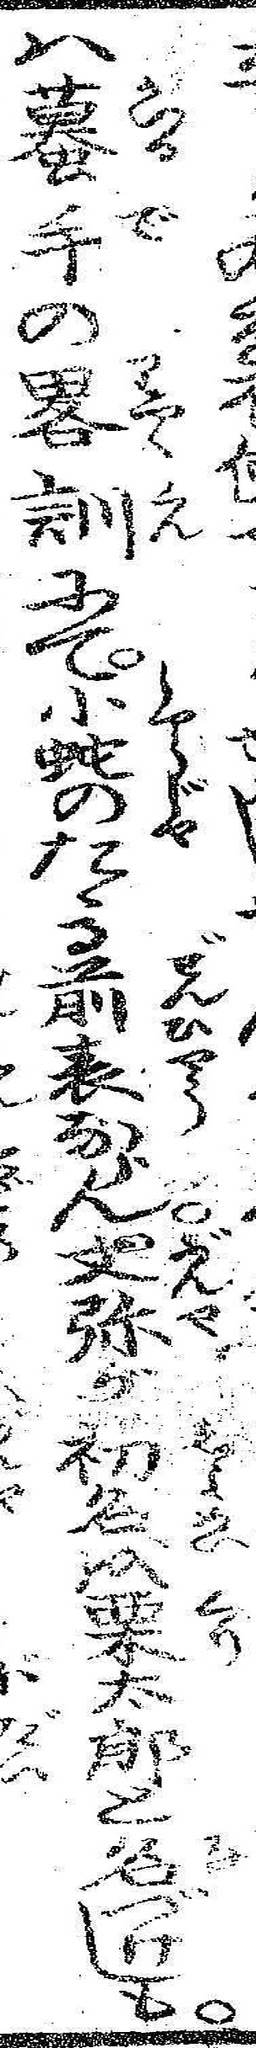は蟇手の略訓にて。小蛇のたゝる前表ならん。文弥が初名を栗太郎と名づしけも。
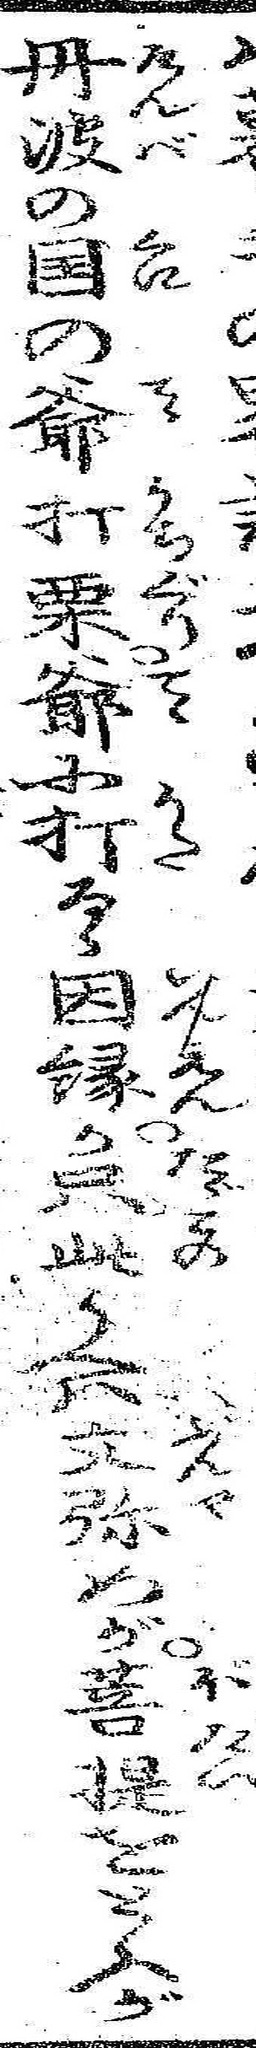丹波の国の爺打栗。爺に打るゝ因縁か。只此うへは文弥めが。菩提をとふが
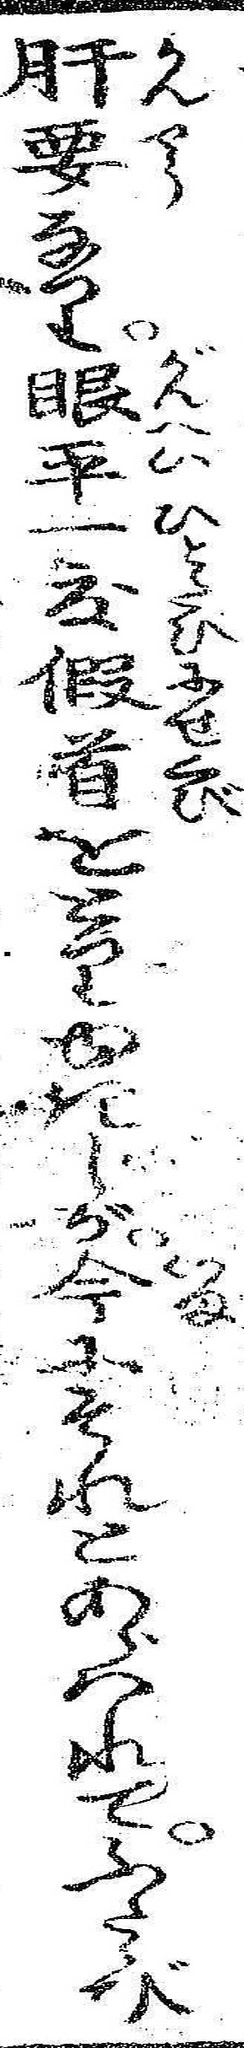肝要なり。眼平一度仮首をとりゆきしが。今にそれとあらはれて。ふたゝび
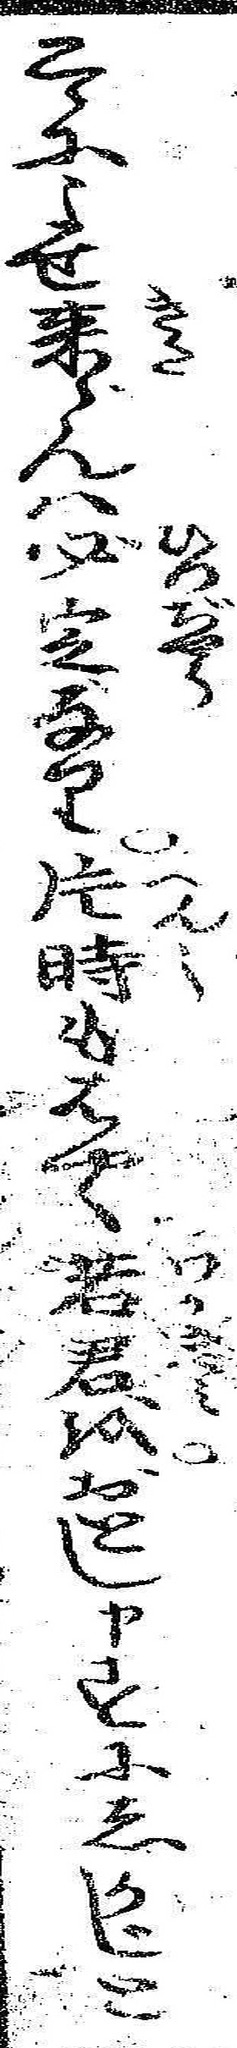こゝによせ来らんは必定なり。片時もはやく若君を。おとし申すにしかじと
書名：昔話稲妻表紙
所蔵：国文学研究資料館
